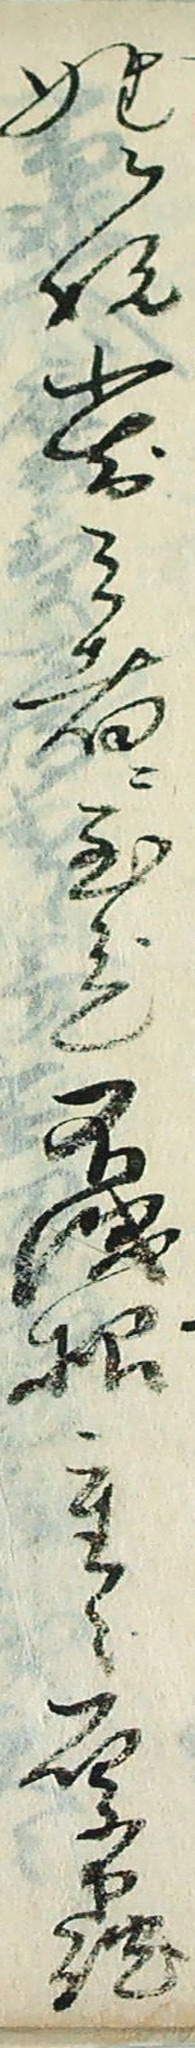姓ヲ始小前之者ニ至迄不洩様重々厚申談
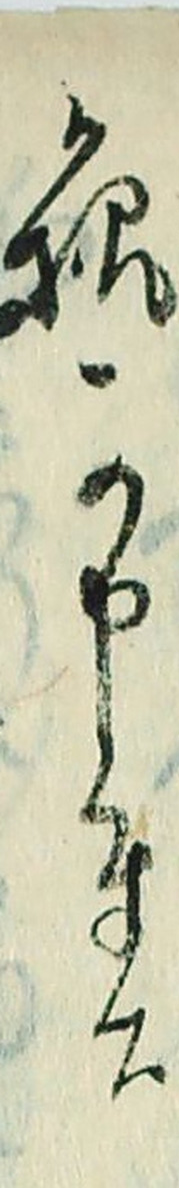候様可申付候
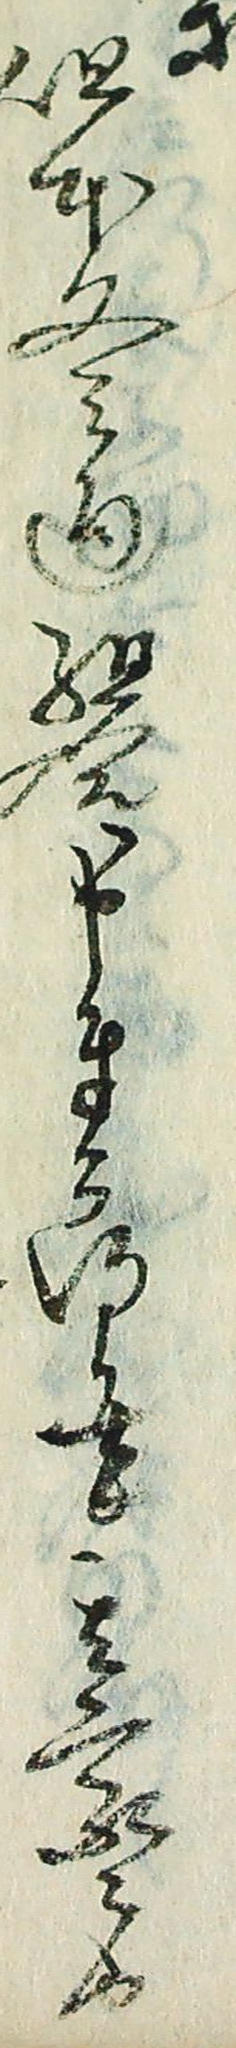但本文之通組合へ申付候得とも其家々ゟ
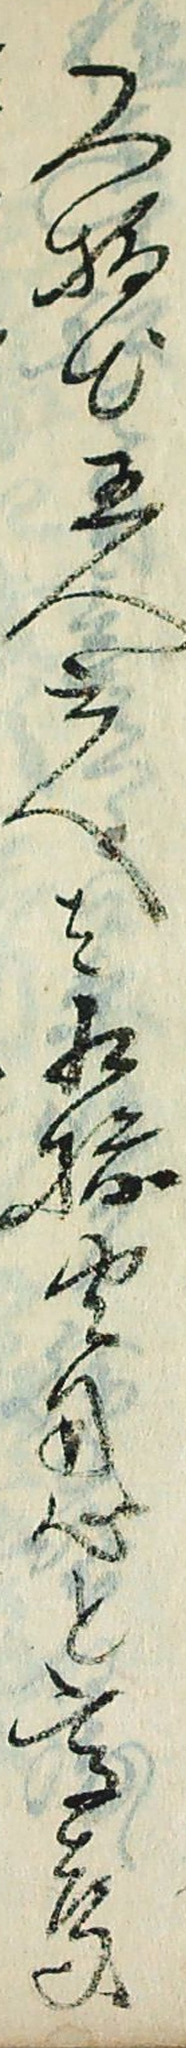一人指出五人六人と相揃火用心と高聲ニ
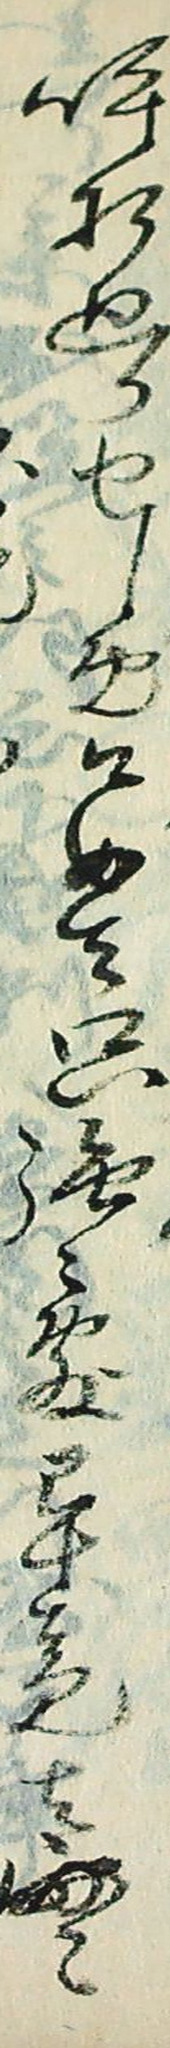呼打廻りせしめ候義者只強々敷畢竟者實
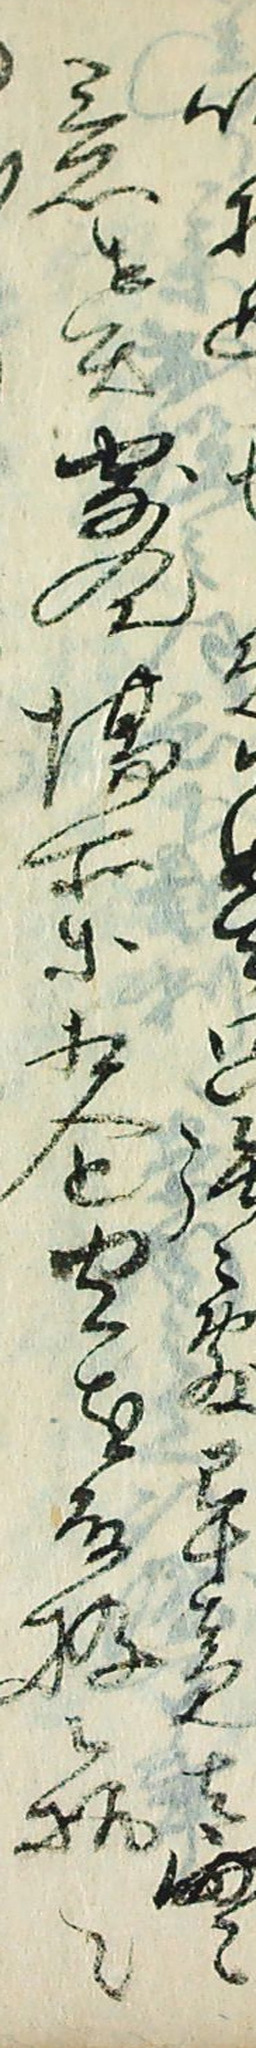意を失寄合場所に相企火を取扱候様之
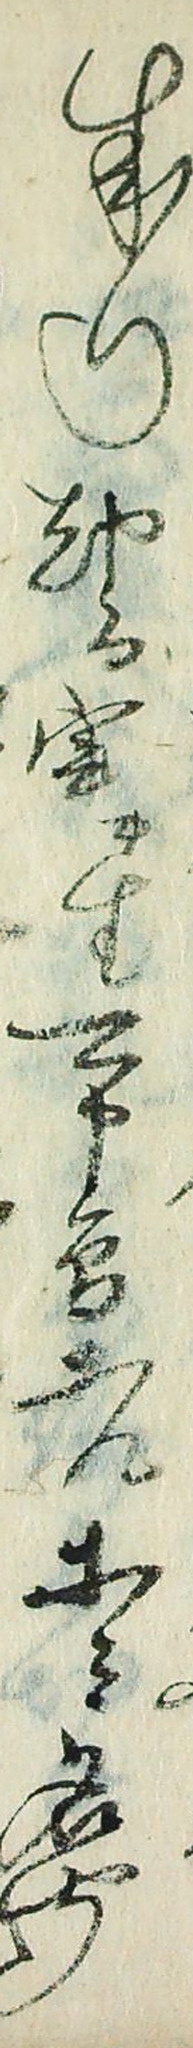成行却而害ヲ生可申候間右等之名聞
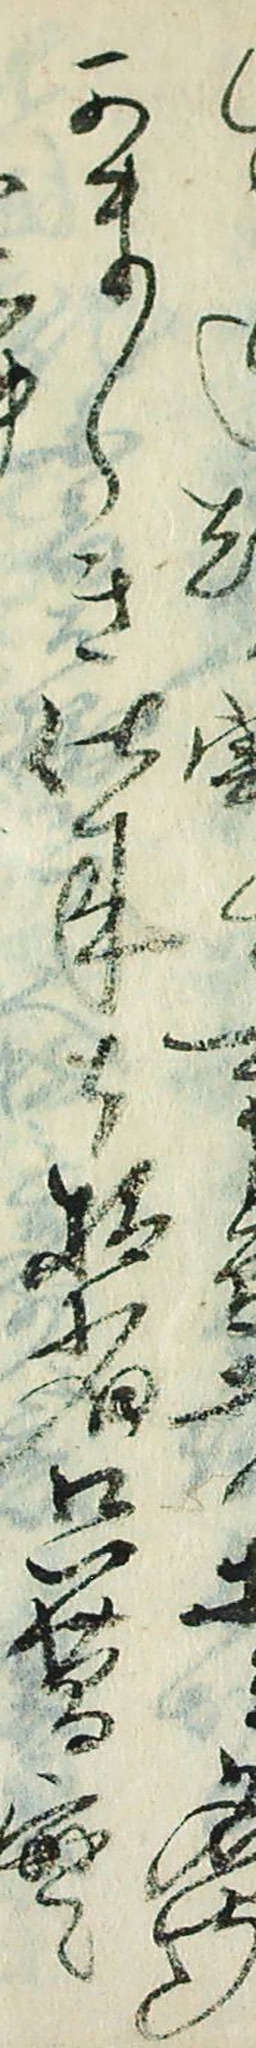かましき仕成者指省只管實
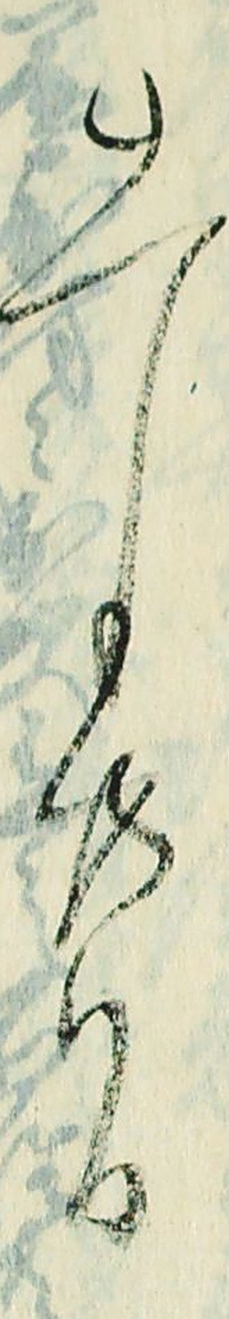十一月廿八日
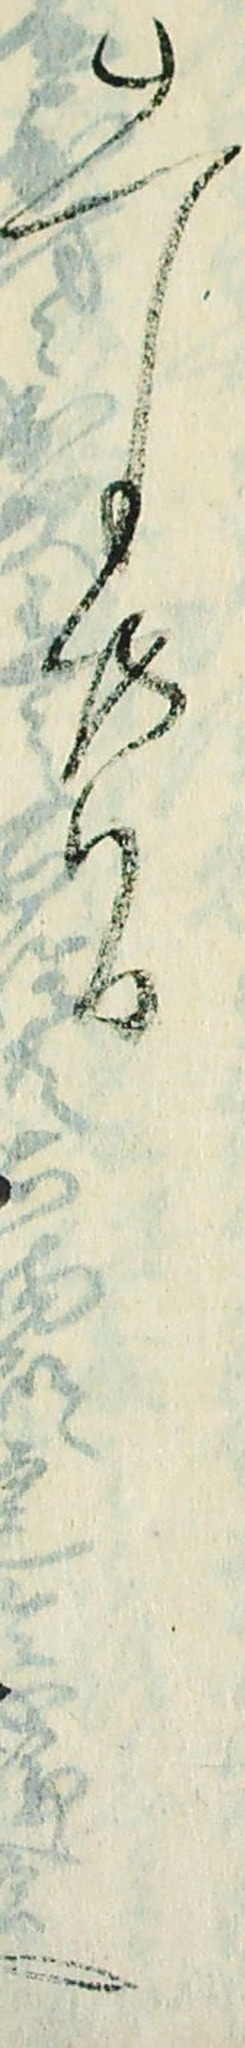十一月廿八日
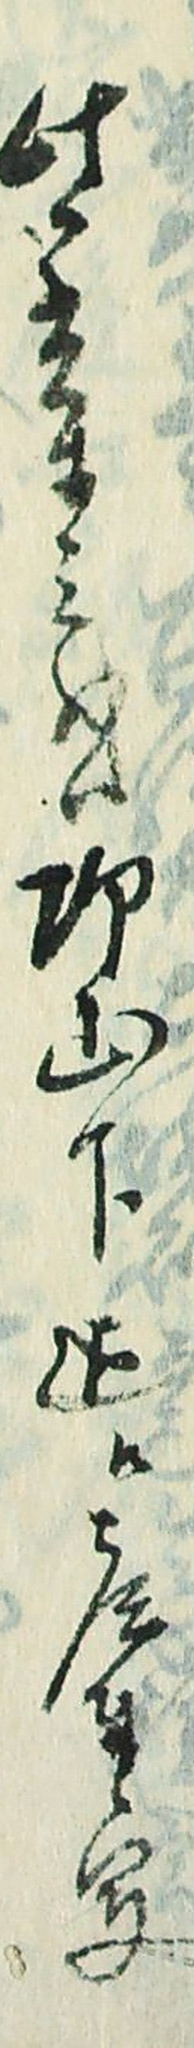此書付之義ハ御山下迄江被仰付候写

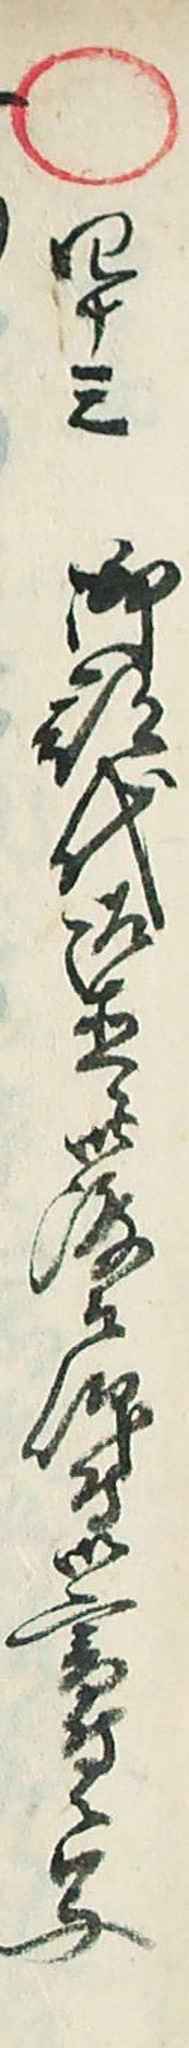○四十三御郡代御直ニ御渡被仰付御書付之写
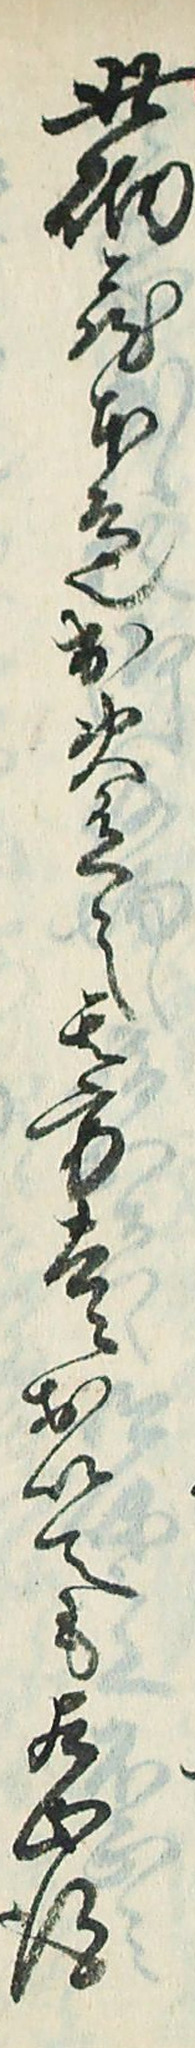此砌蔵本邊出火有之其方共ニおいても相心得
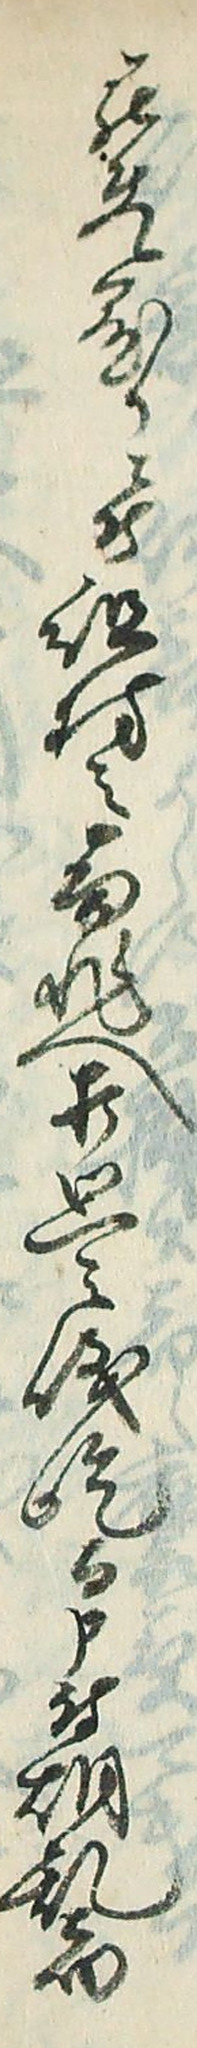罷在候懸りニ付組村之番非人打廻之儀屹と申付胡乱者
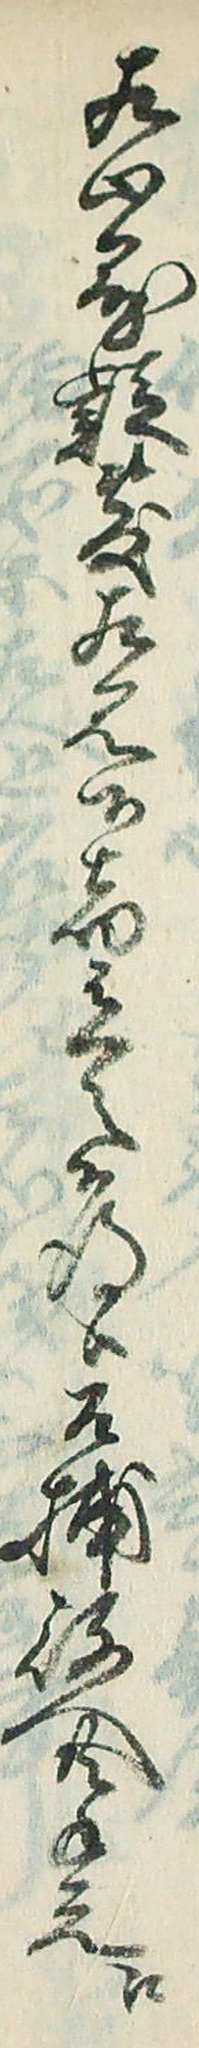相心懸疑敷相見候者有之候得ハ召捕役人共手元江
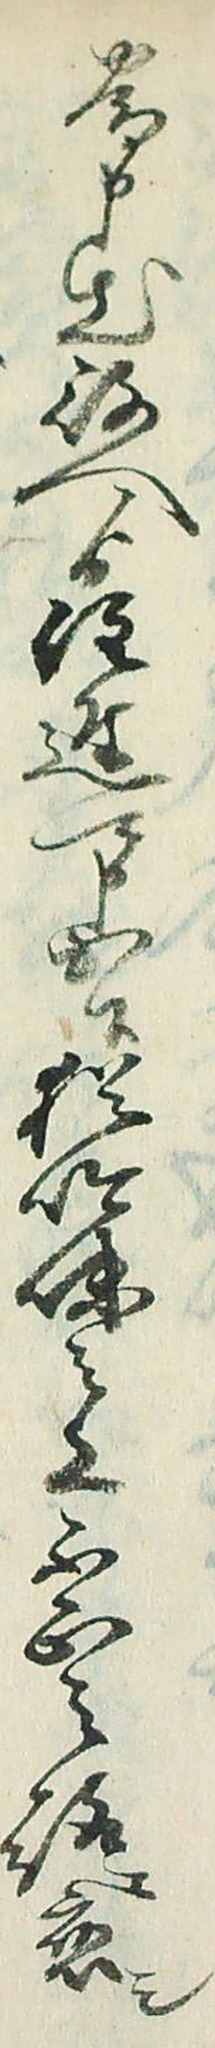為申出役人ゟ注進可申出候猶吟味之上不正之趣ニ應シ
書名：諸御趣意書并御下知向之写
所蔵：鳴門教育大学 Naruto University of Education
